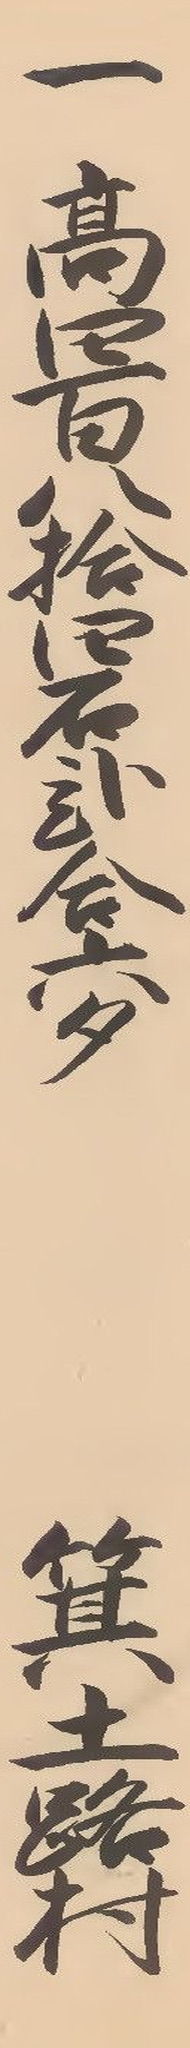一高四百八拾四石弐合六勺箕土路村
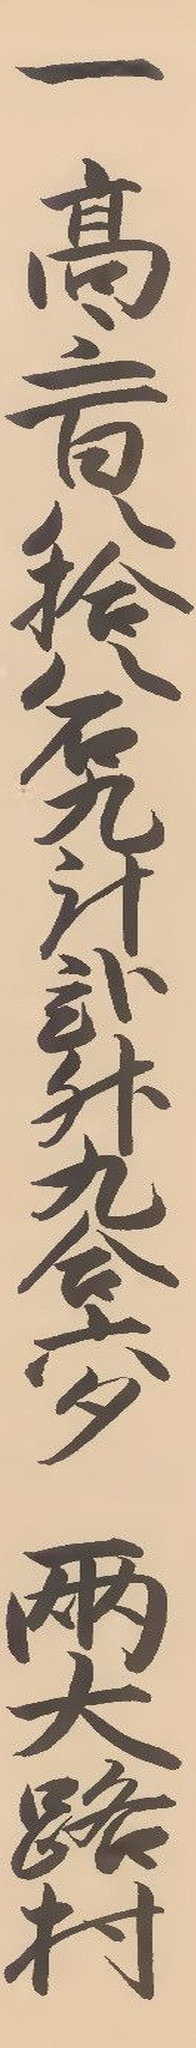一高三百八拾八石九斗弐升九合六勺両大路村
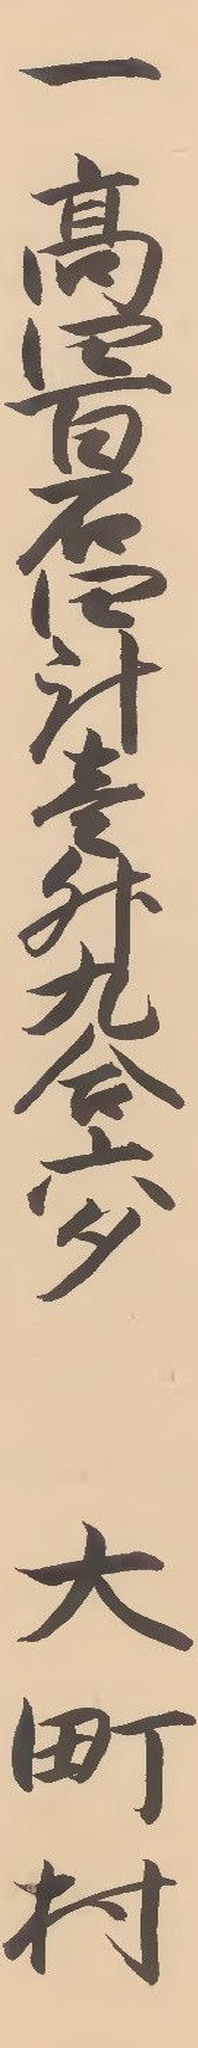一高四百石四斗壱升九合六勺大町村
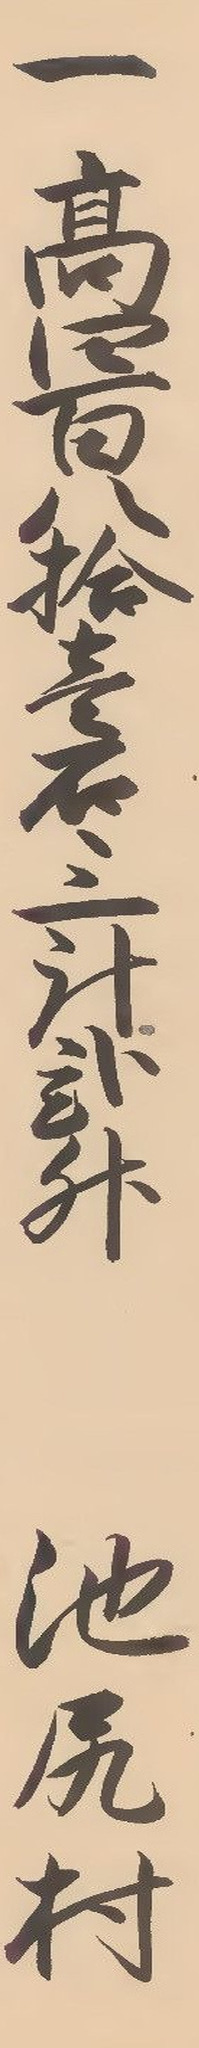一高四百八拾壱石三斗弐升池尻村

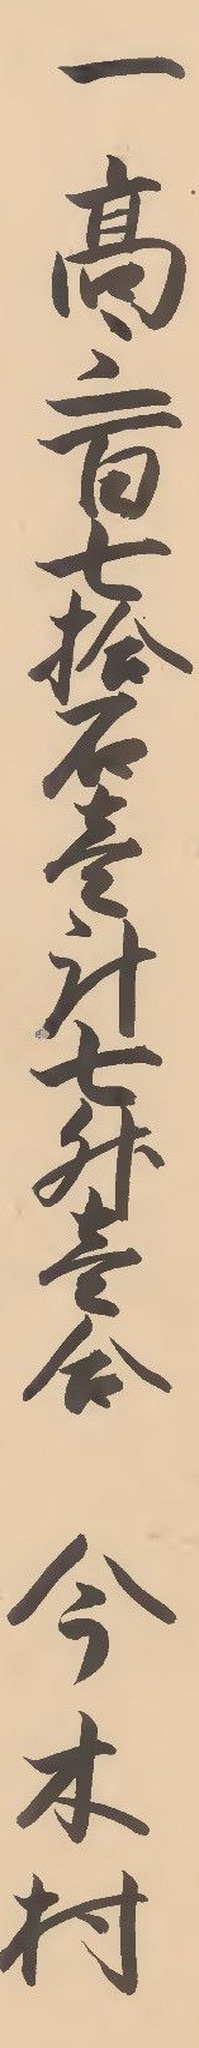一高三百七拾石壱斗七升壱合今木村
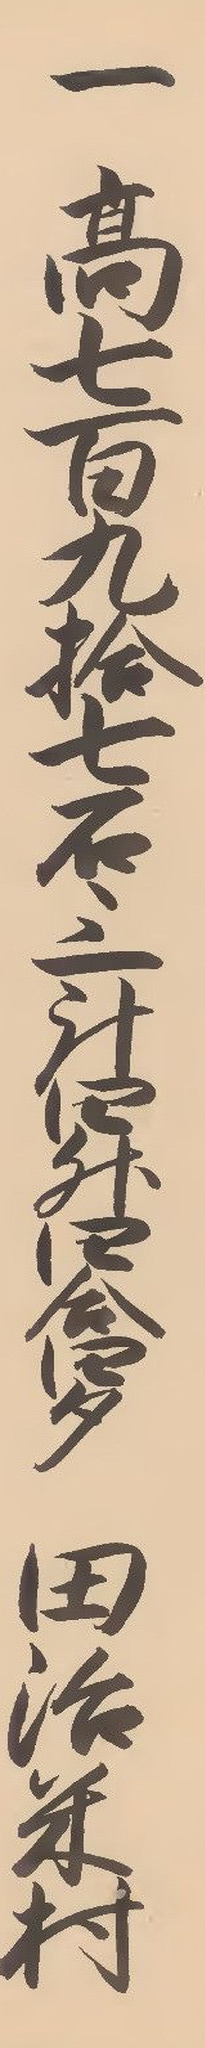一高七百九拾七石三斗四升四合四勺田治米村
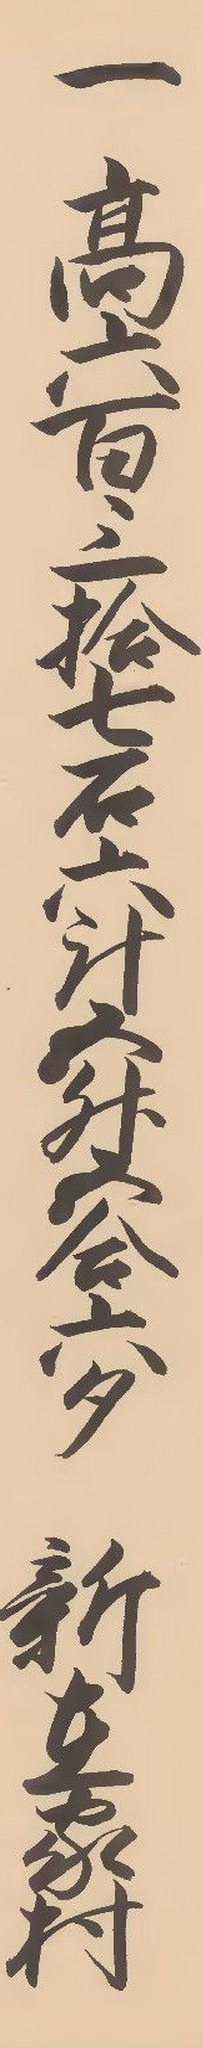一高六百三拾七石六斗五升五合六勺新在家村
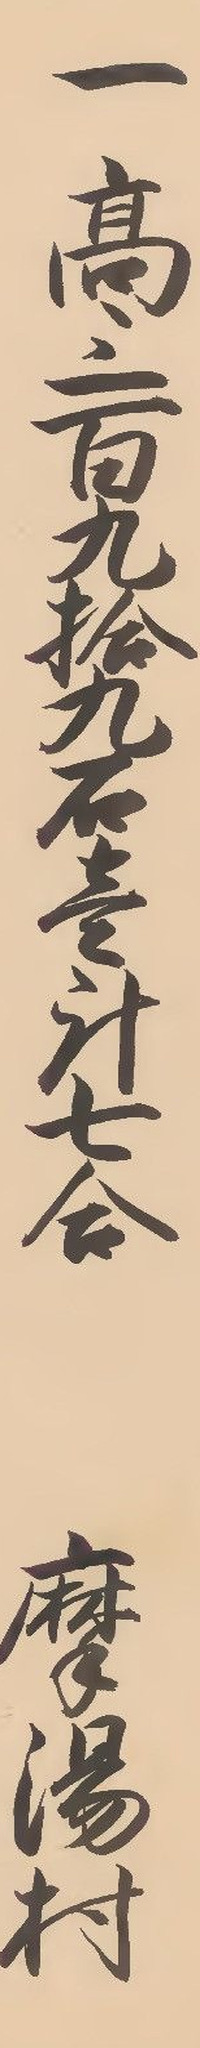一高三百九拾九石壱斗七合摩湯村
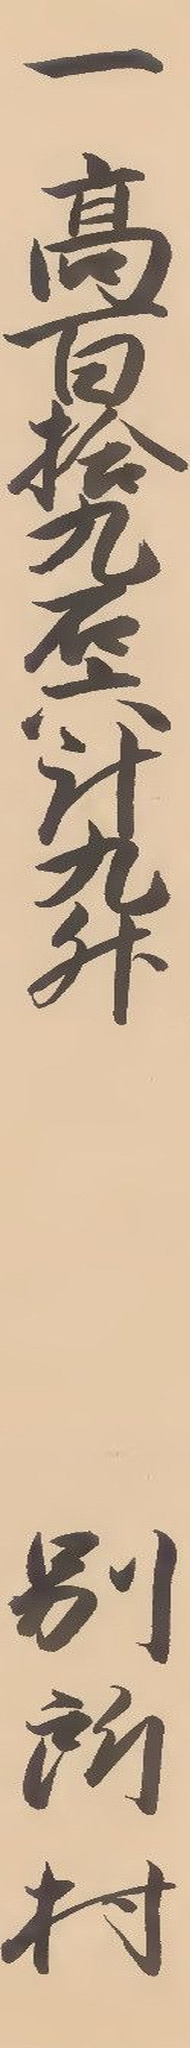一高百拾九石六斗九升別所村
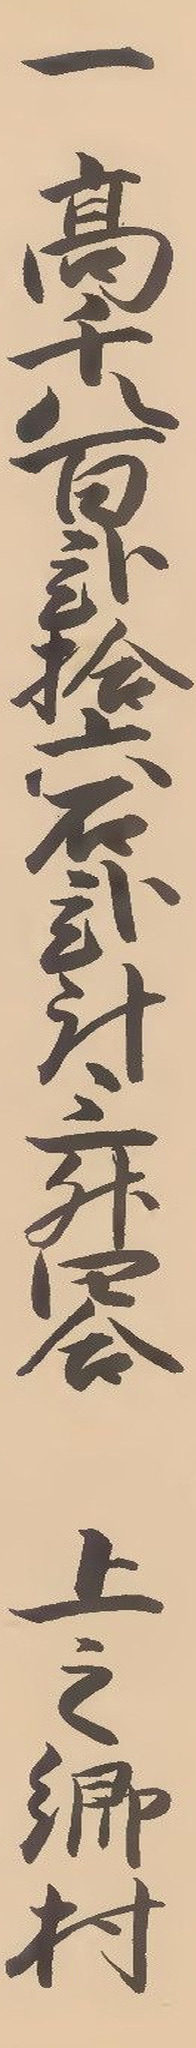一高千八百弐拾六石弐斗三升四合上之郷村
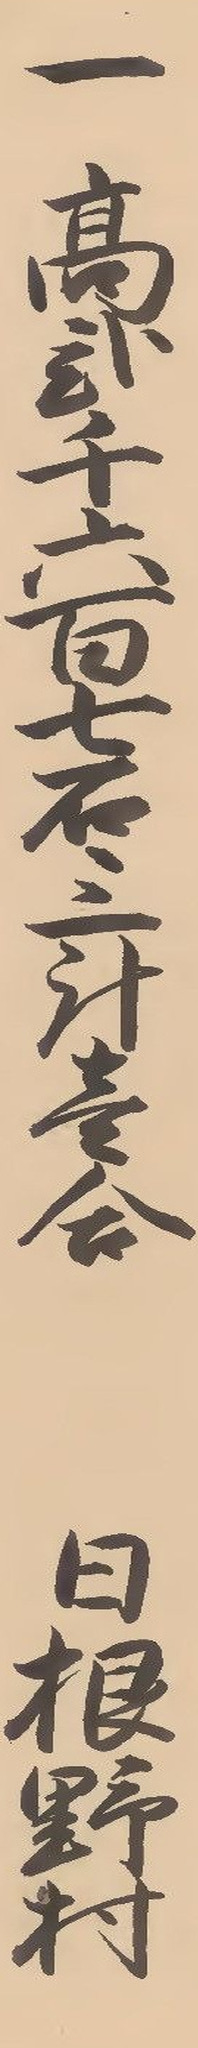一高弐千六百七石三斗壱合日根野村
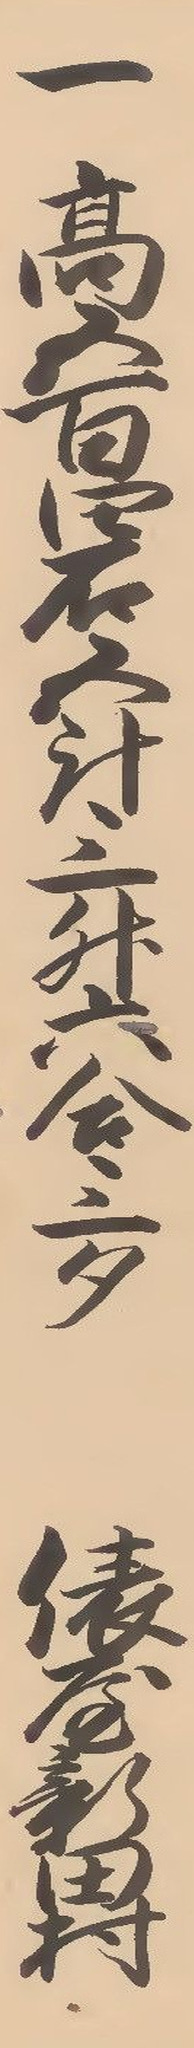一高五百四石五斗三升六合三勺俵屋新田村

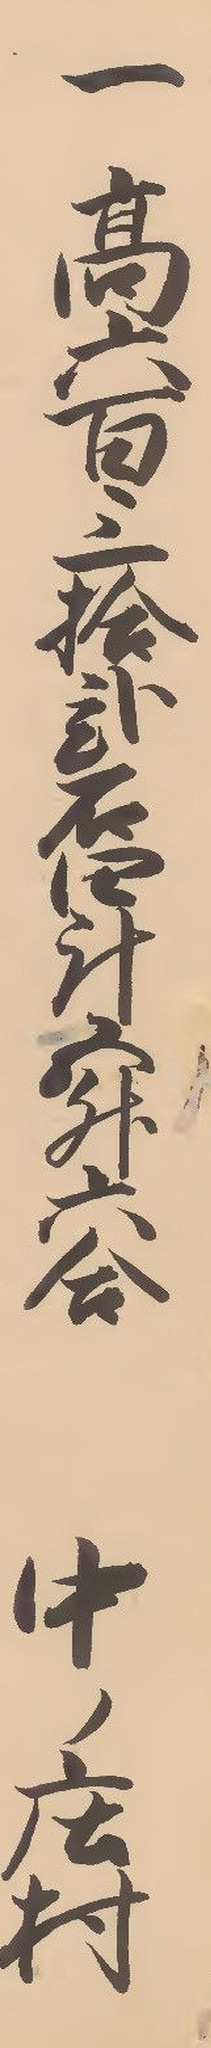一高六百三拾弐石四斗五升六合中ノ庄村
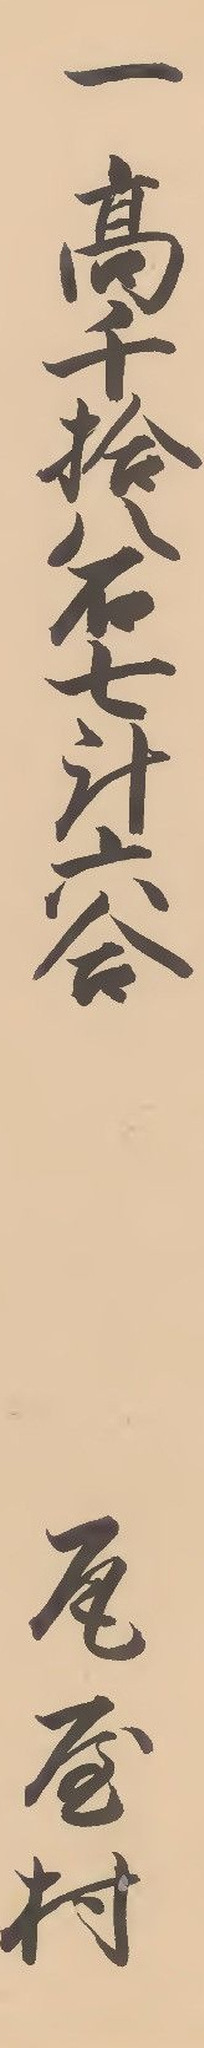一高千拾八石七斗六合瓦屋村
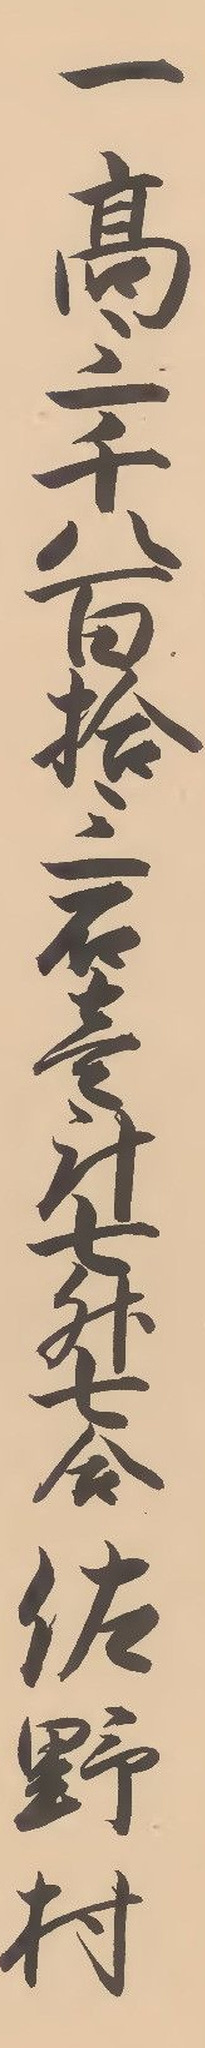一高三千八百拾三石壱斗七升七合佐野村
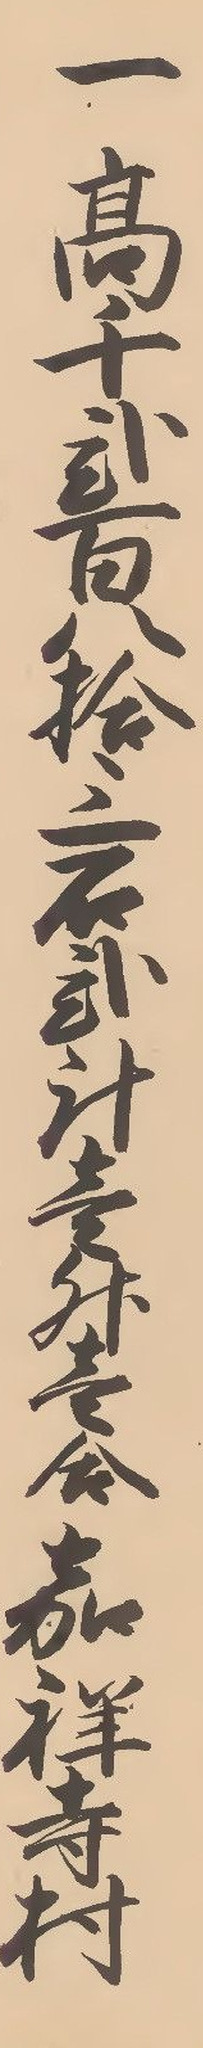一高千弐百八拾三石弐斗壱升壱合嘉祥寺村
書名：和泉国郷帳
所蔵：国立公文書館 National Archives of Japan
